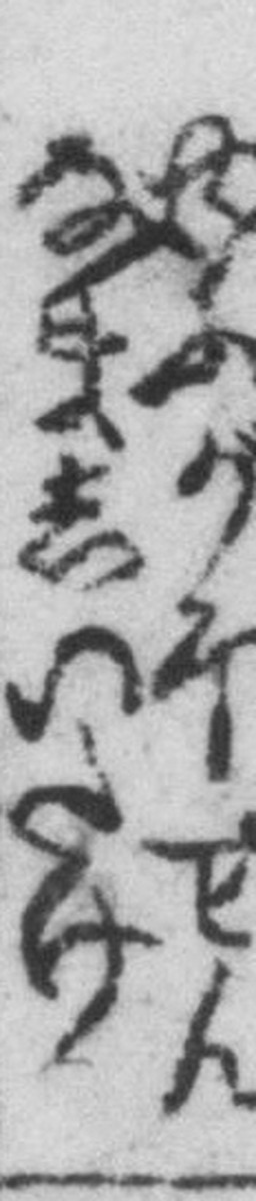なましいたけ
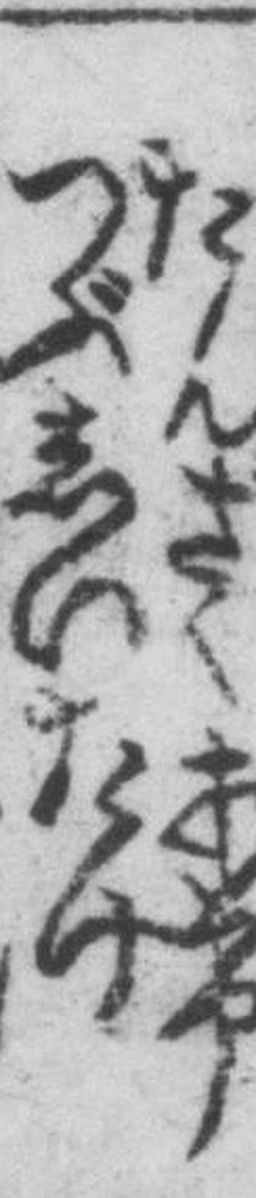なましいたけ
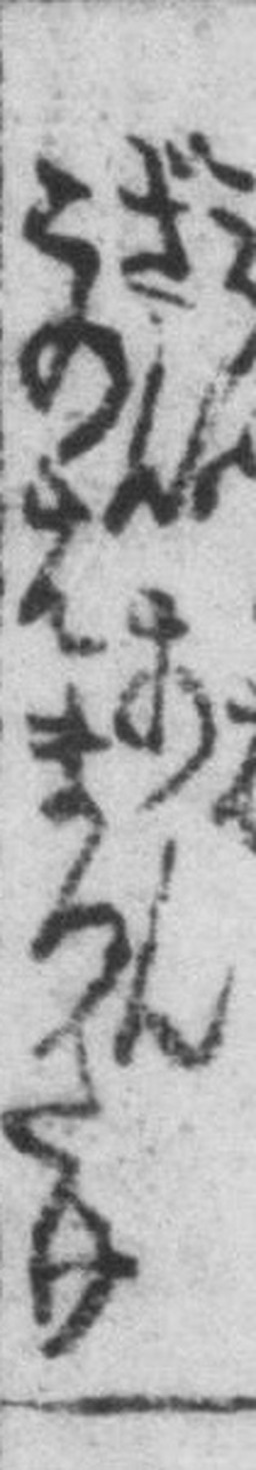このはまつたけ
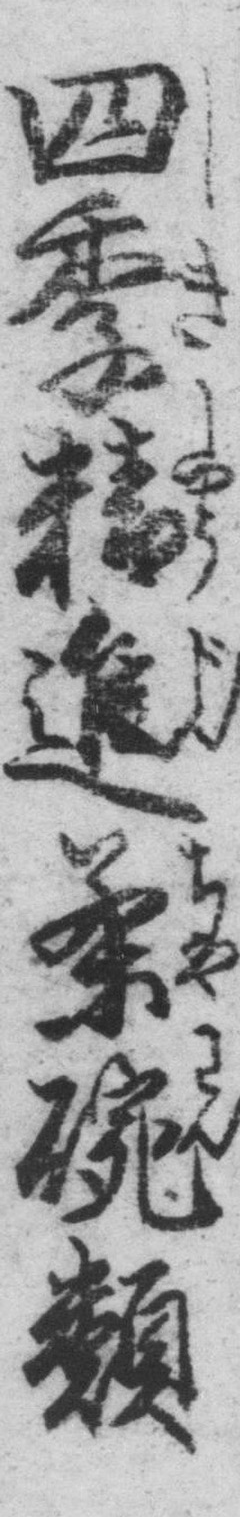四季精進茶碗類

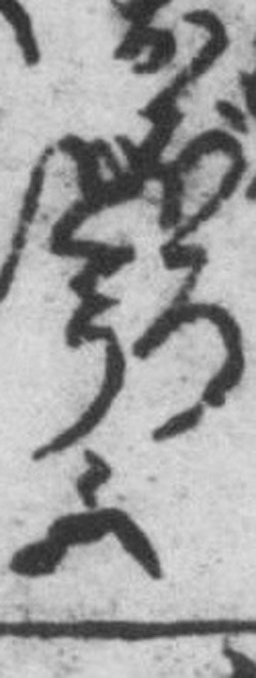どうふ
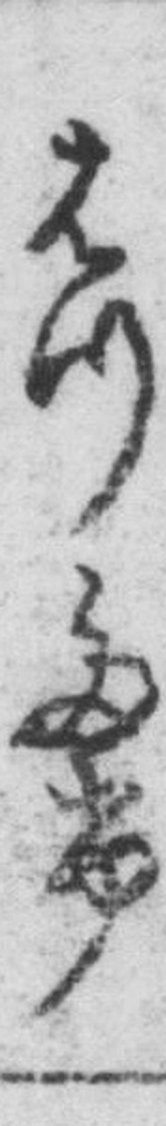はつだけ
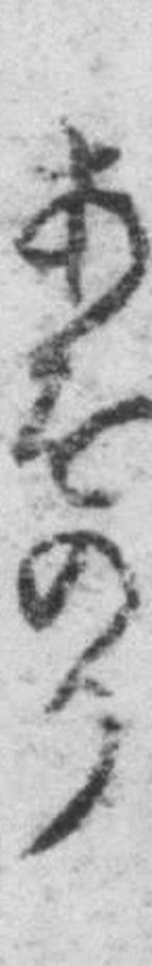あをのり
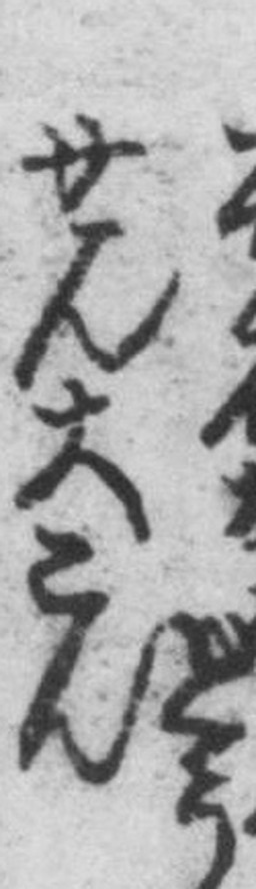せん大こん
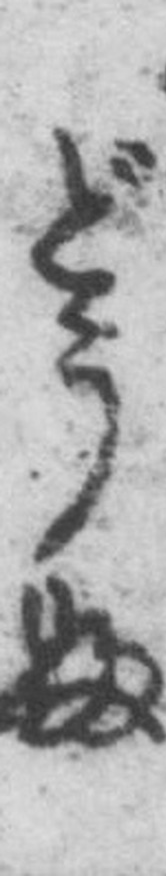どうふ
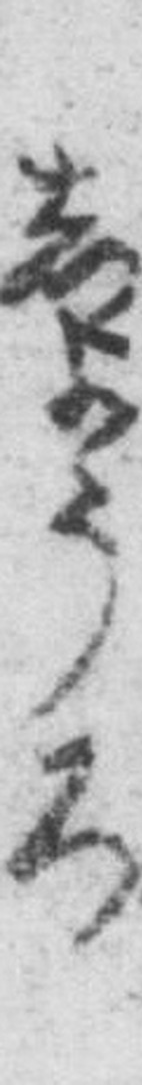しようろ
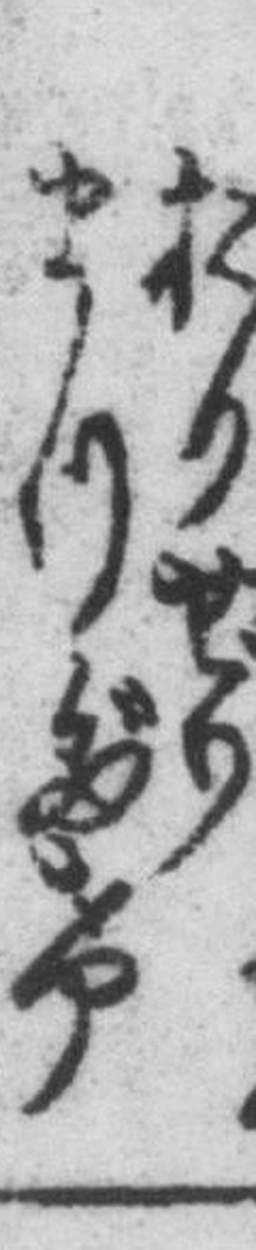はつだけ
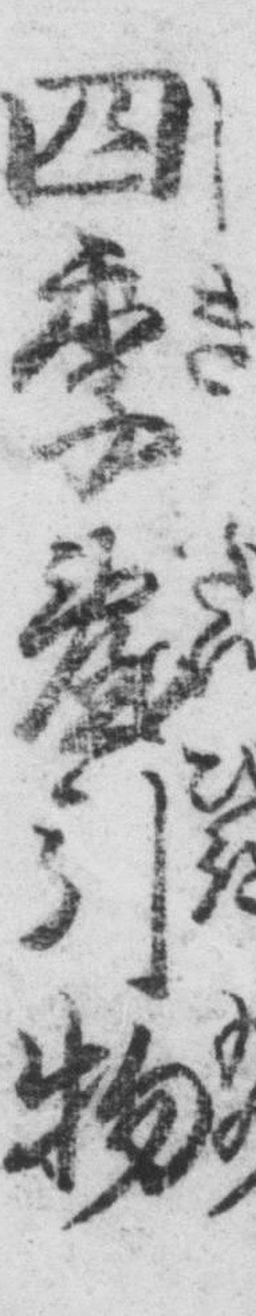四季臺引物
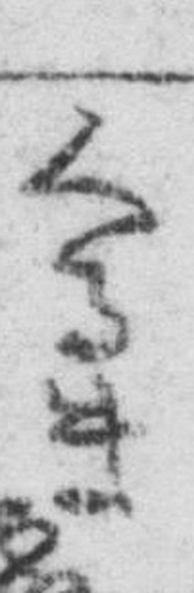くるま
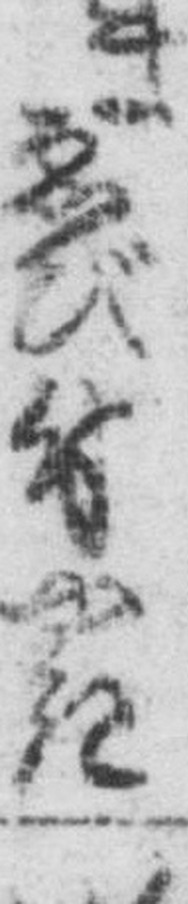ゑび付やき
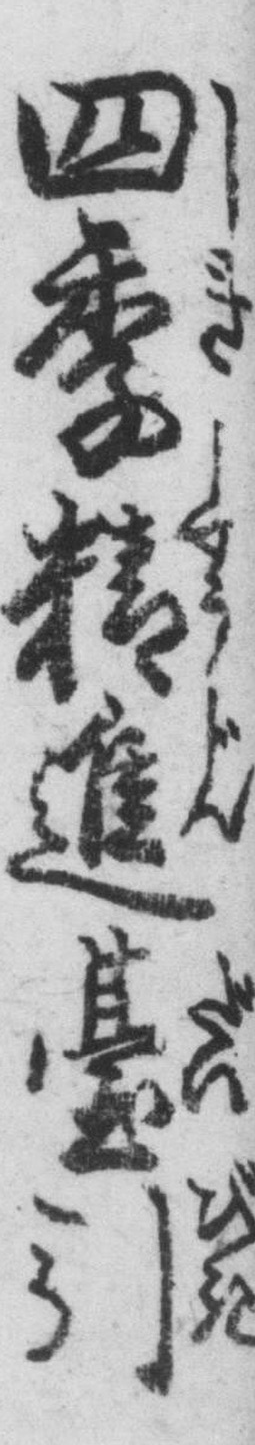四季精進臺引
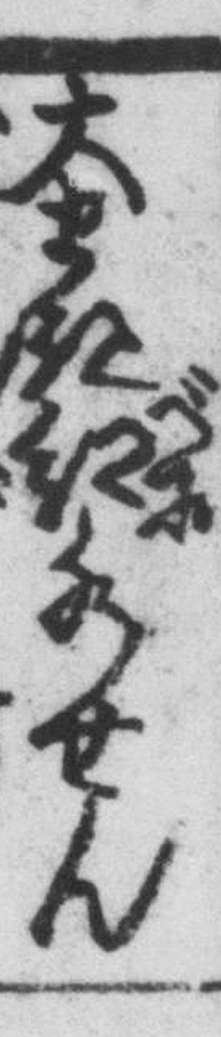大まき紅水せん
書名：即席庖丁
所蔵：大阪府立大学学術情報センター 国文学研究資料館
